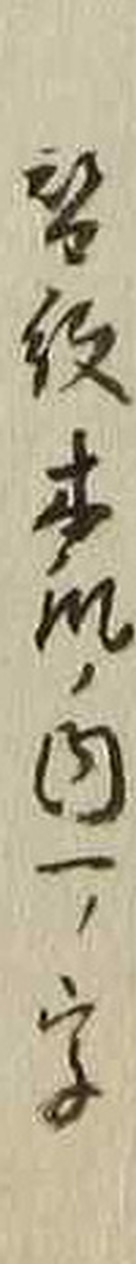替紋木瓜ノ内一ノ字
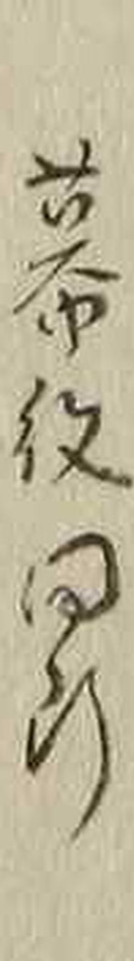幕紋同断
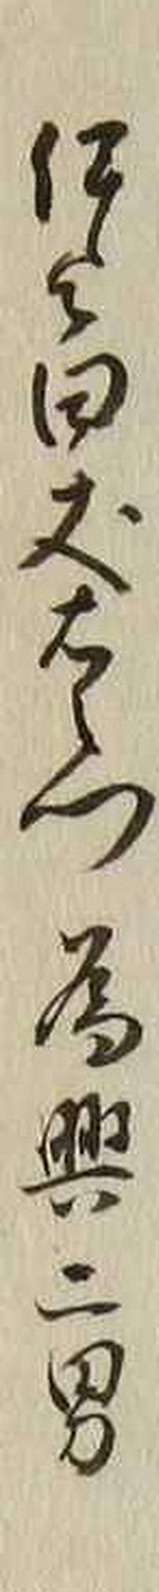伊与田丈右衛門為興二男
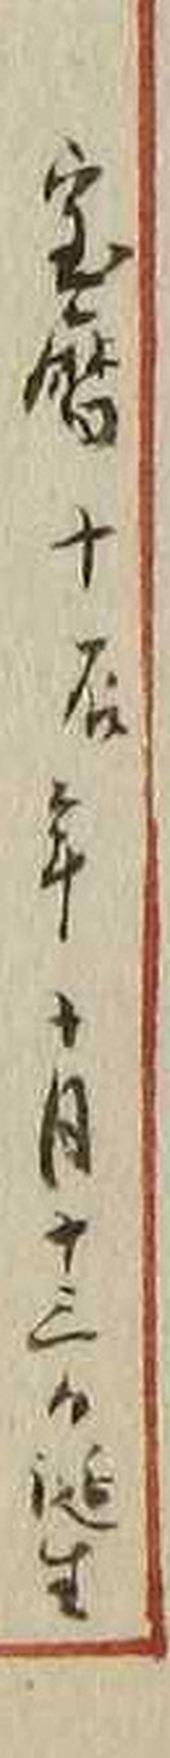宝暦十辰十月十三日誕生
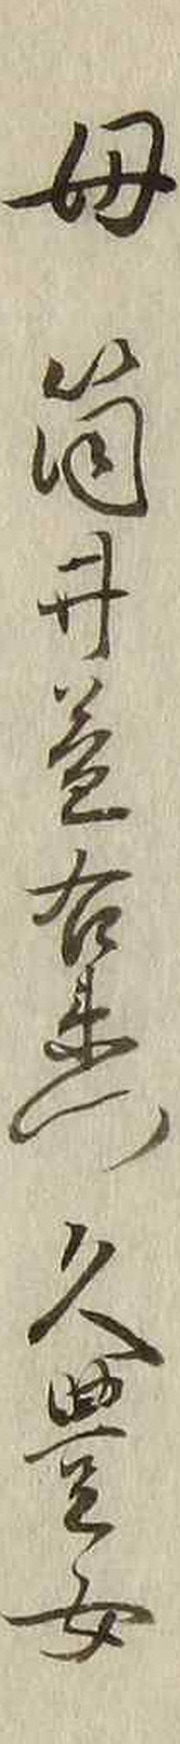母筒井益右衛門久豊女
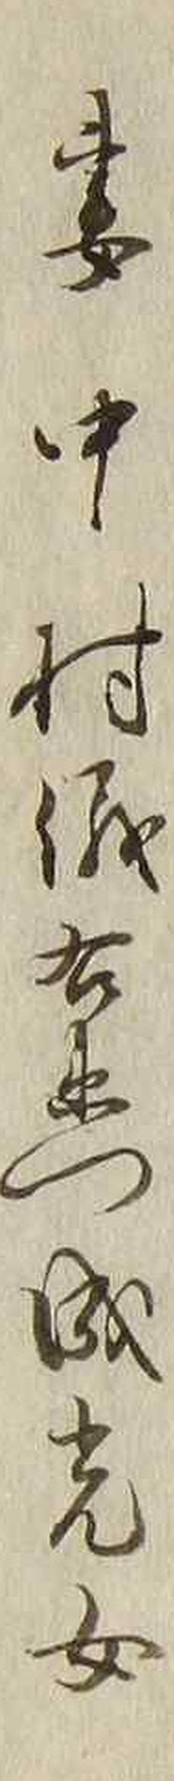妻中村儀右衛門成光女
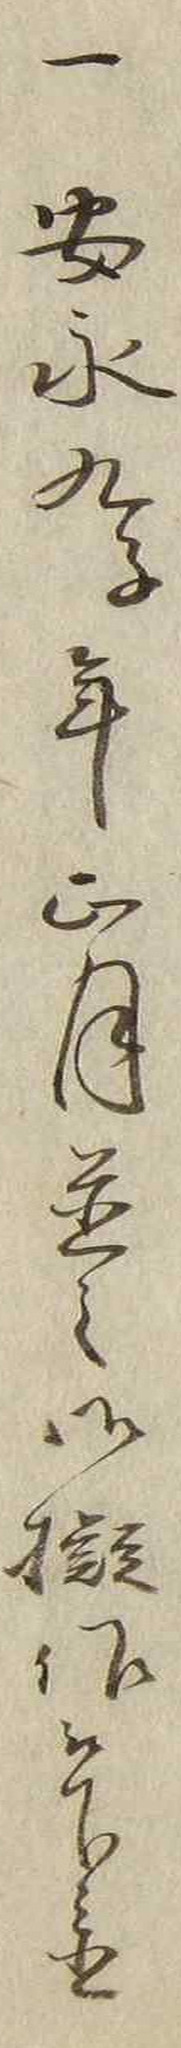一安永九子年正月並之御擬作被下置

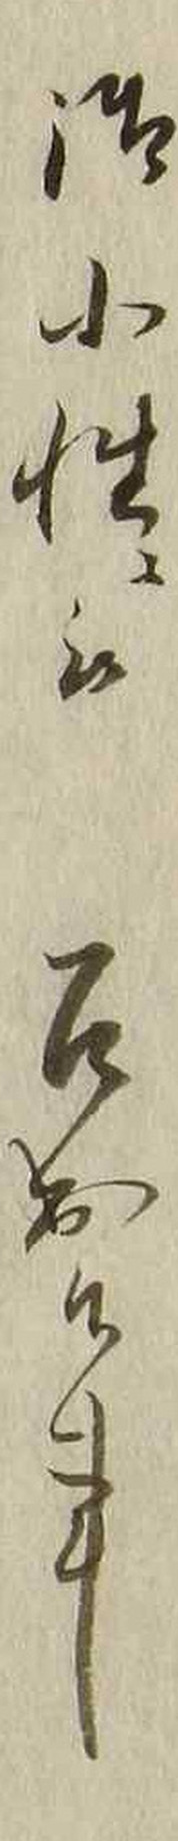御小性ニ被召出候事
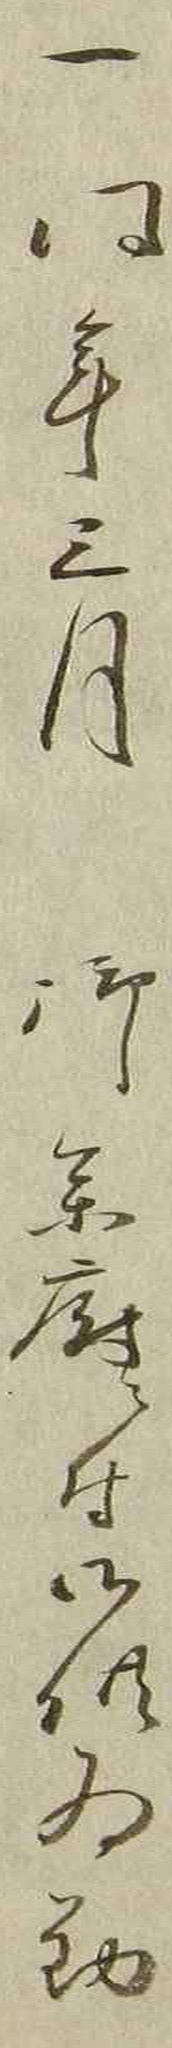一同年三月御参府ニ付御供為勤
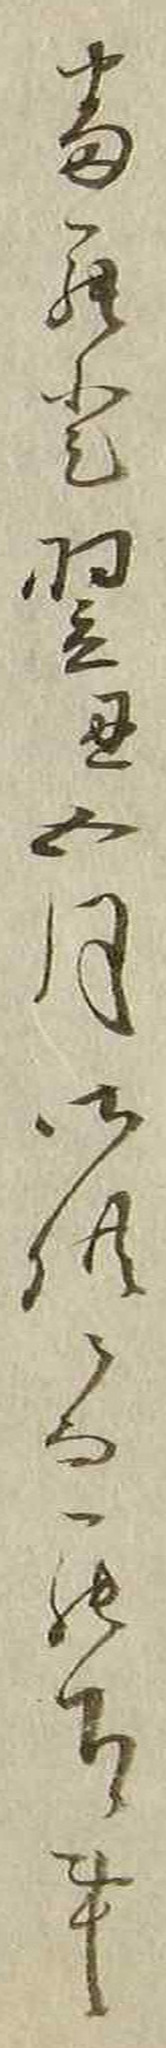番罷登翌丑五月御供ニ而罷下候事
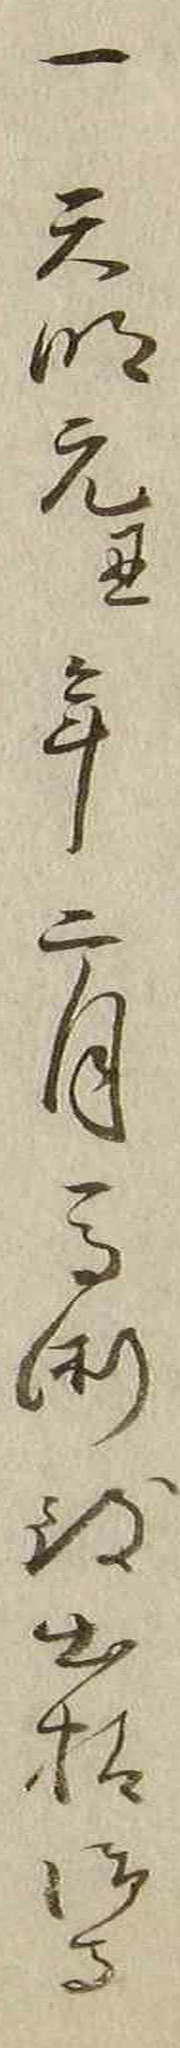一天明元丑年月二月馬術致出精御馬
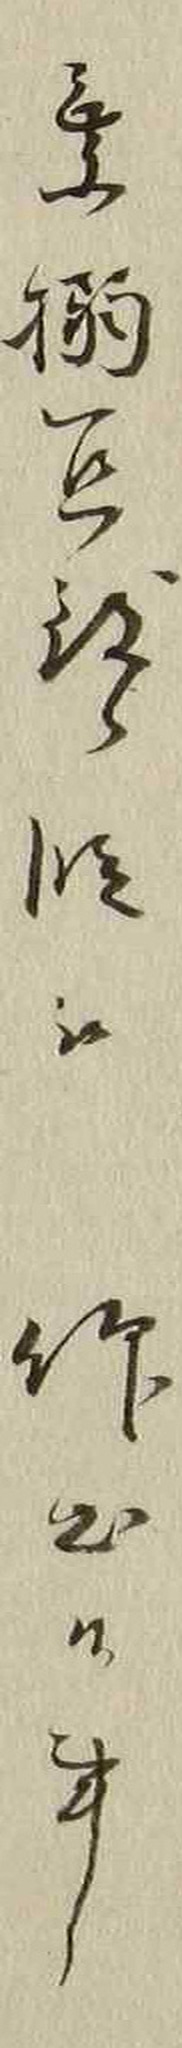集搦宜致候段被仰出候事
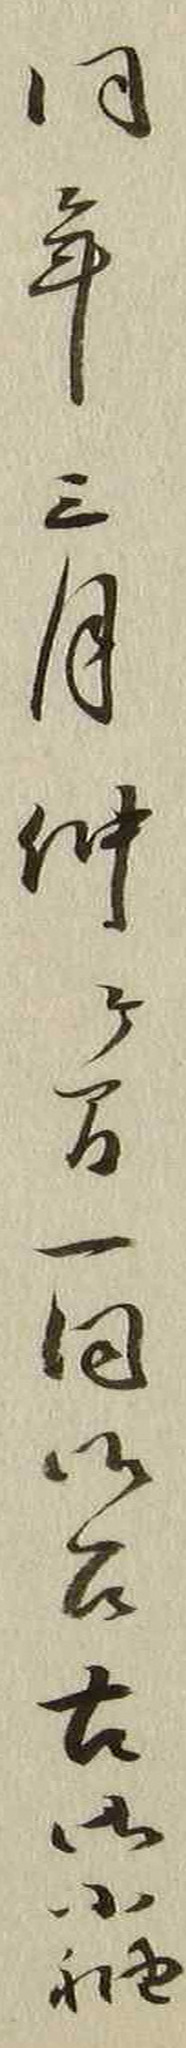一同年三月仲ケ間一同御召古御小袖
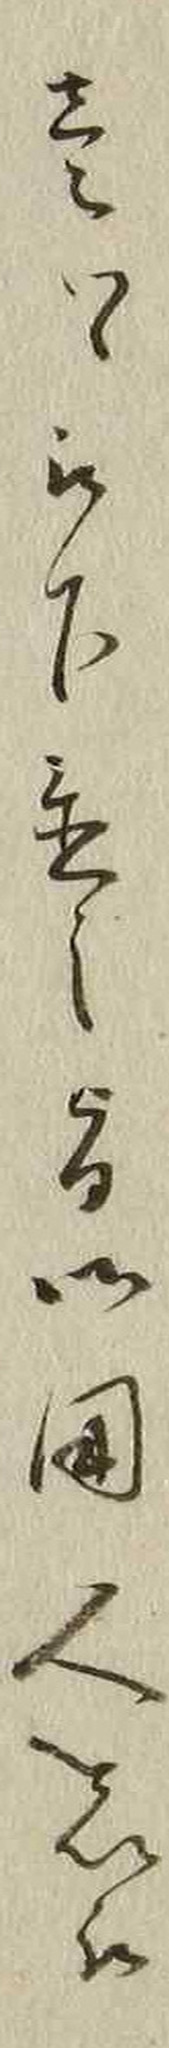壱ツヽ被下置之旨御用人を以被
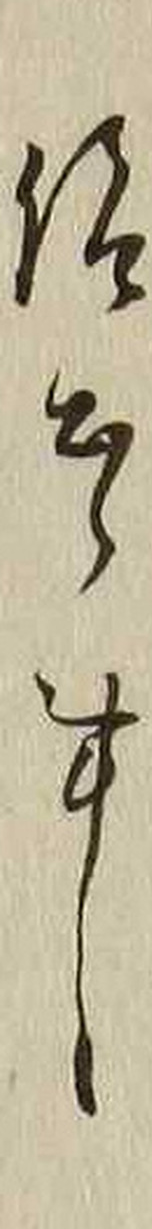仰出候事
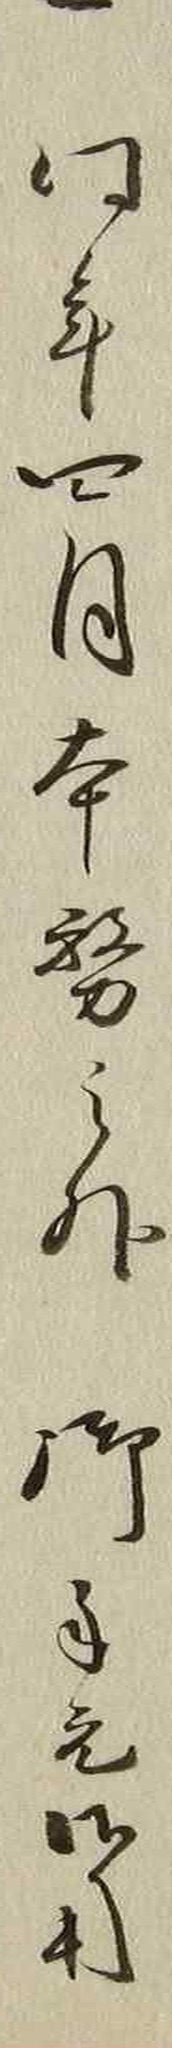一同年四月本務之外御手元御用
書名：諸士系譜　巻之25　い之部25
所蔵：会津若松市立会津図書館
